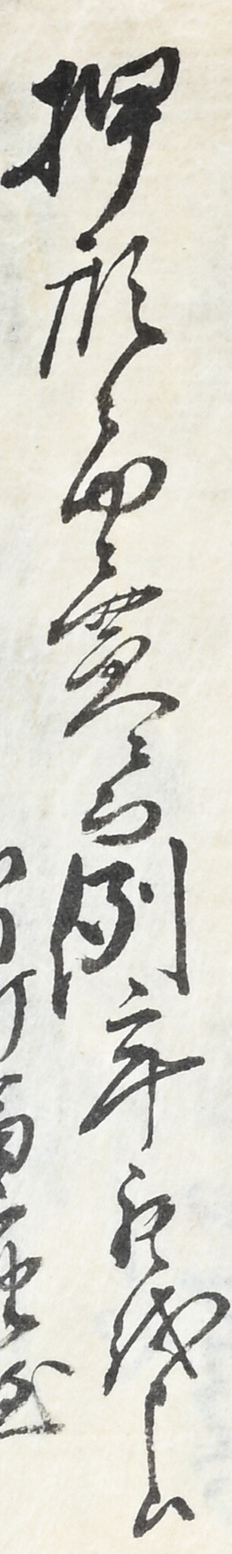小間物商売ニ而例年罷越申候

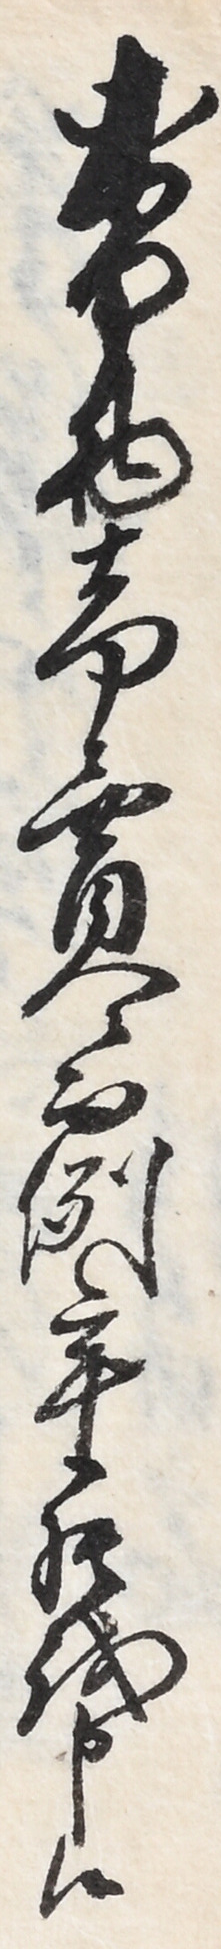薬商売ニ而例年罷越申候
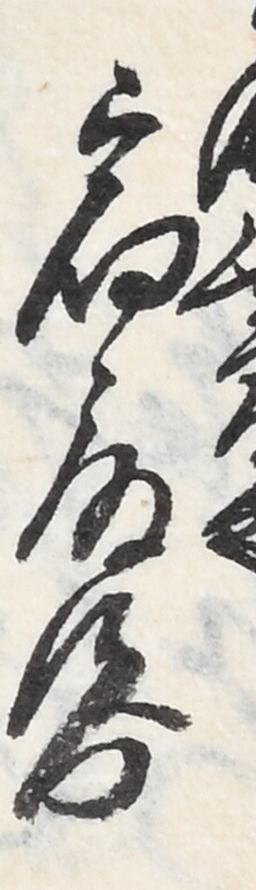宿久右衛門
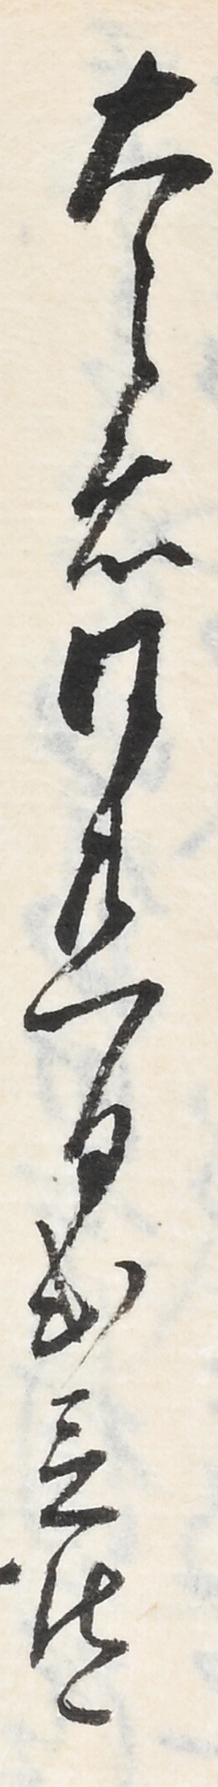右之者同廿六日出立仕候
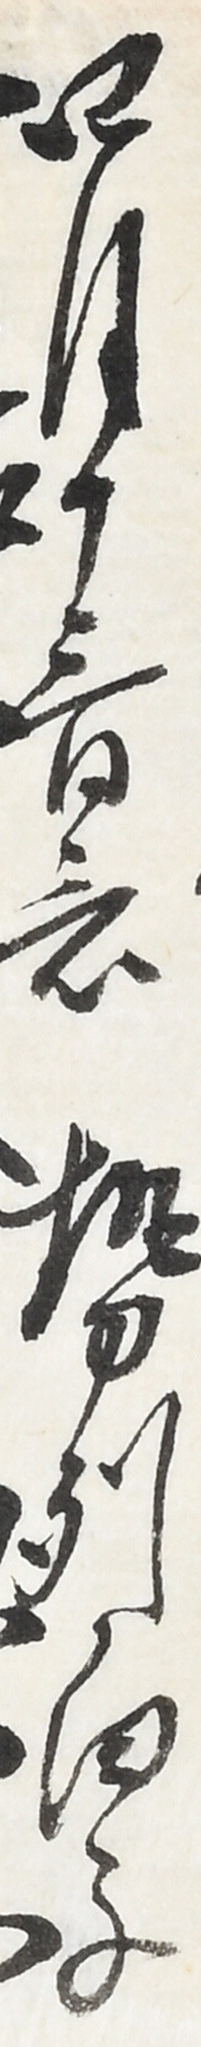四月十三日着勢州白子
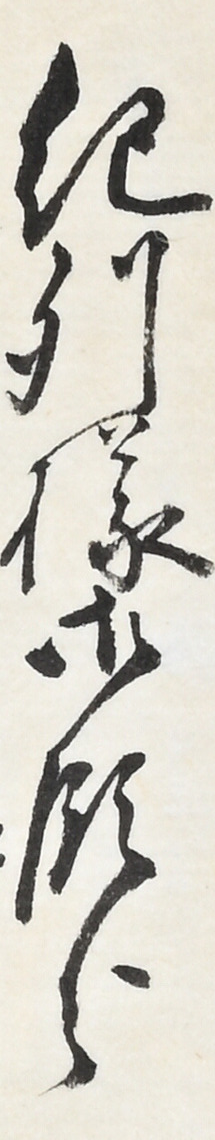紀州様御領分
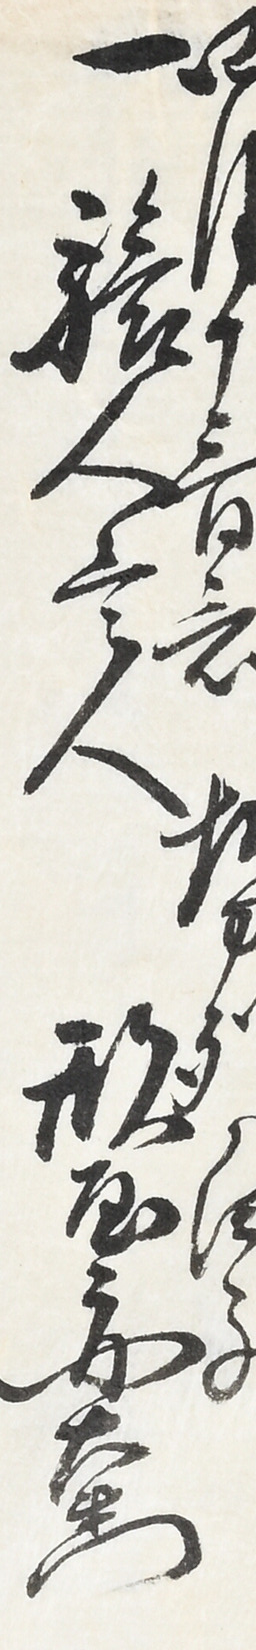一旅人壱人形屋亦右衛門
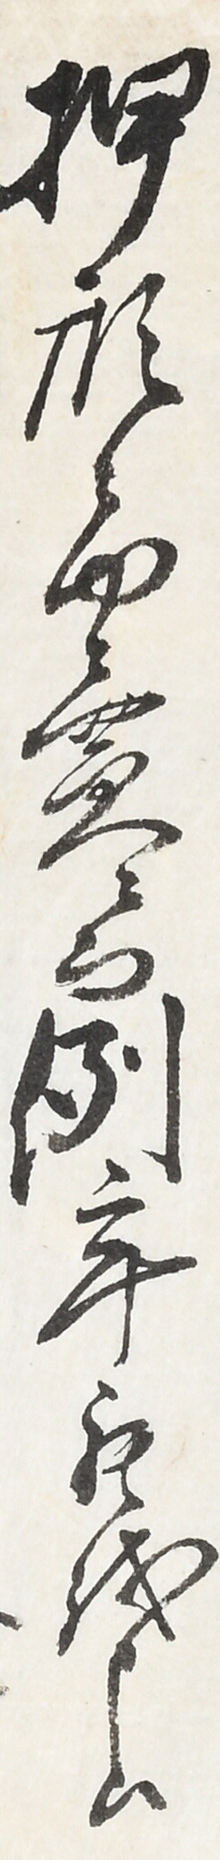押形商売ニ而例年罷越申候
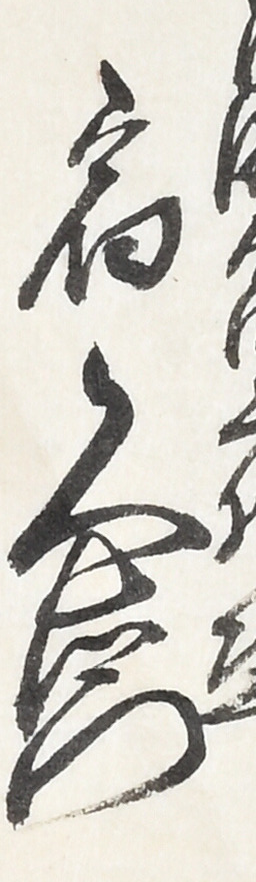宿久右衛門
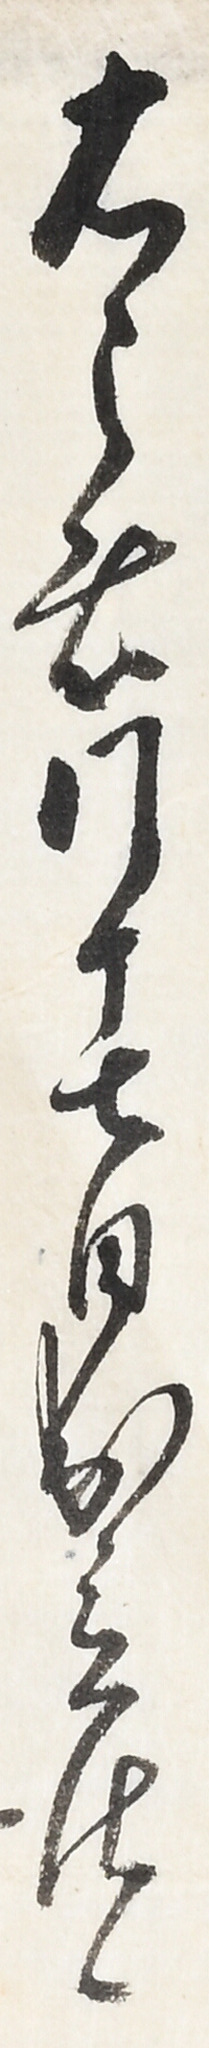右之者同十七日出立仕候
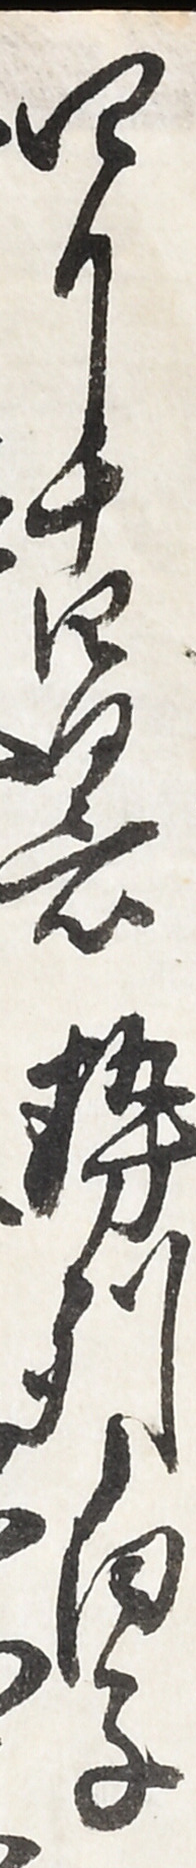四月十四日着勢州白子
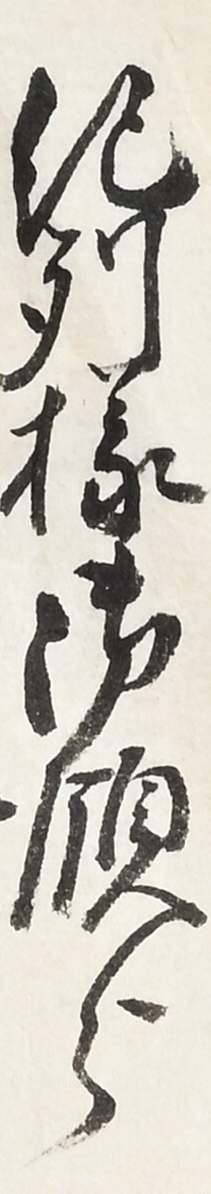紀州様御領分
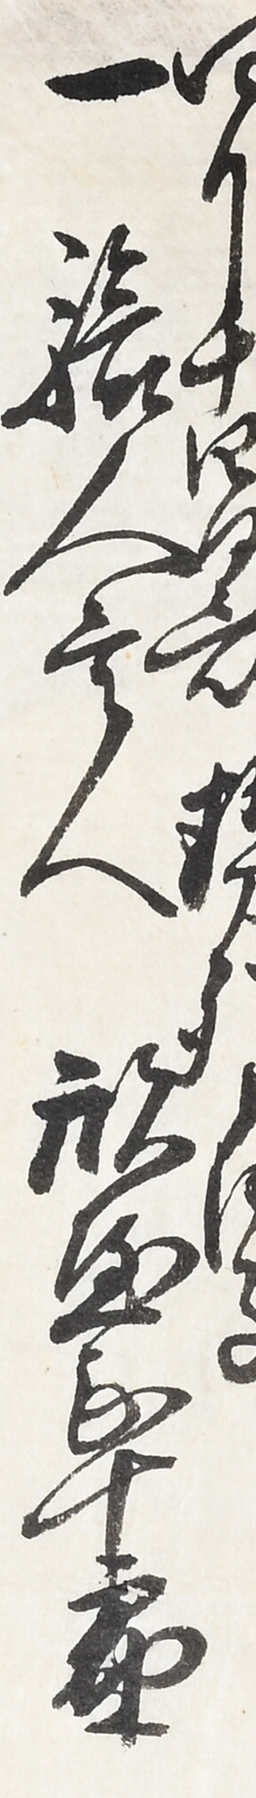一旅人壱人形屋甚十郎
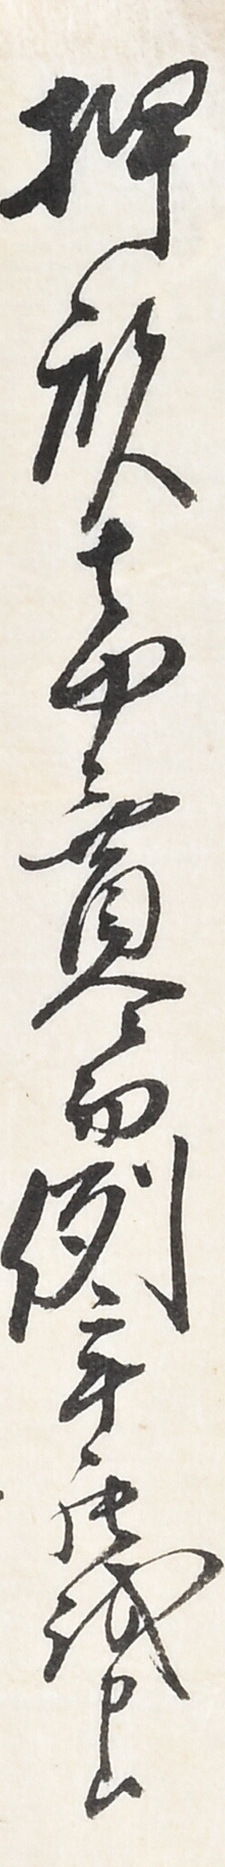押形商売ニ而例年罷越申候
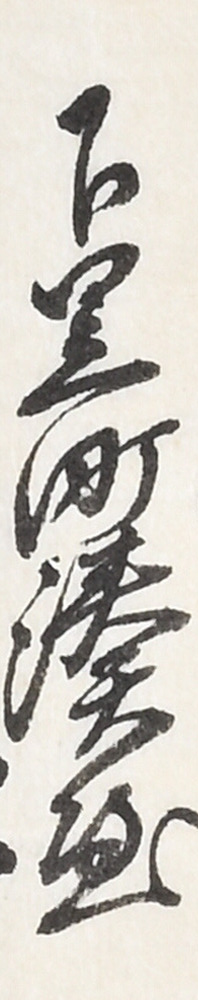下里町湊屋
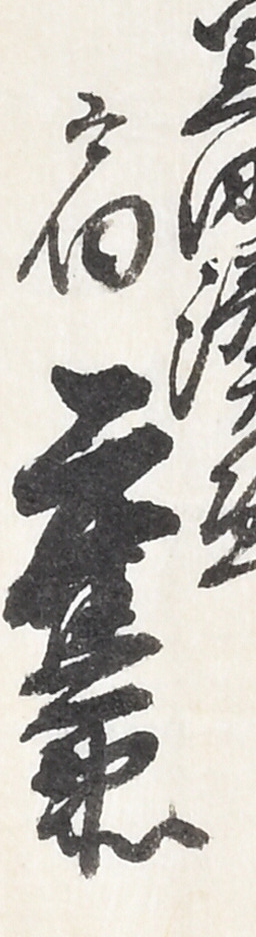宿平兵衛
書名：旅人泊控帳
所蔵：伊那市立高遠町図書館・合同会社AMANE
